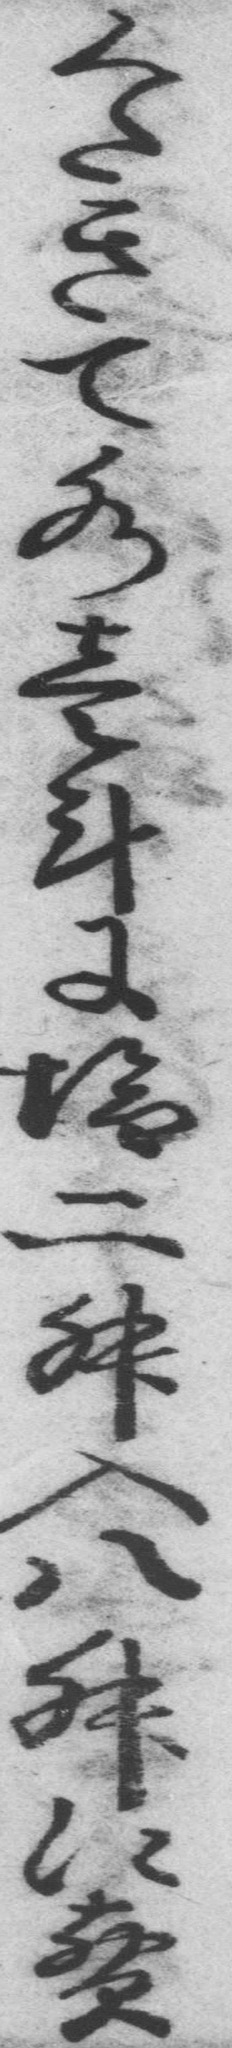くたきて水壱斗に塩二升入八升に煮
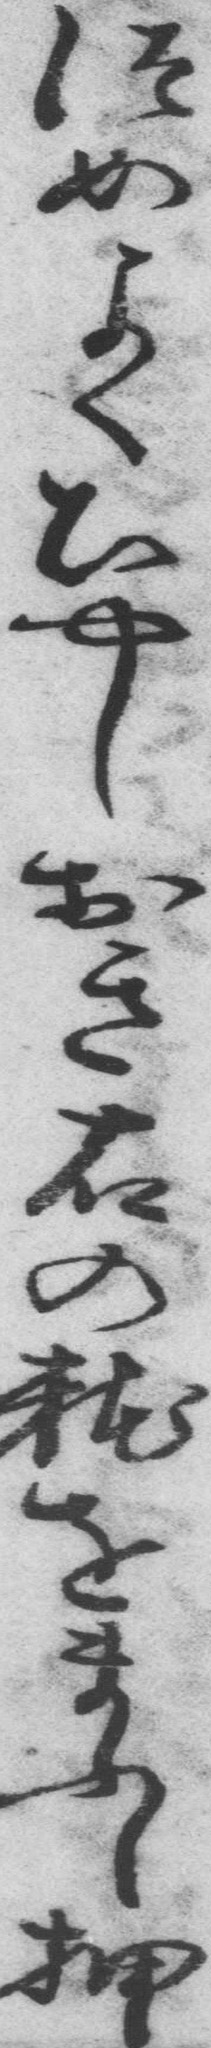つめよくひやしおき右の糀をまふし押
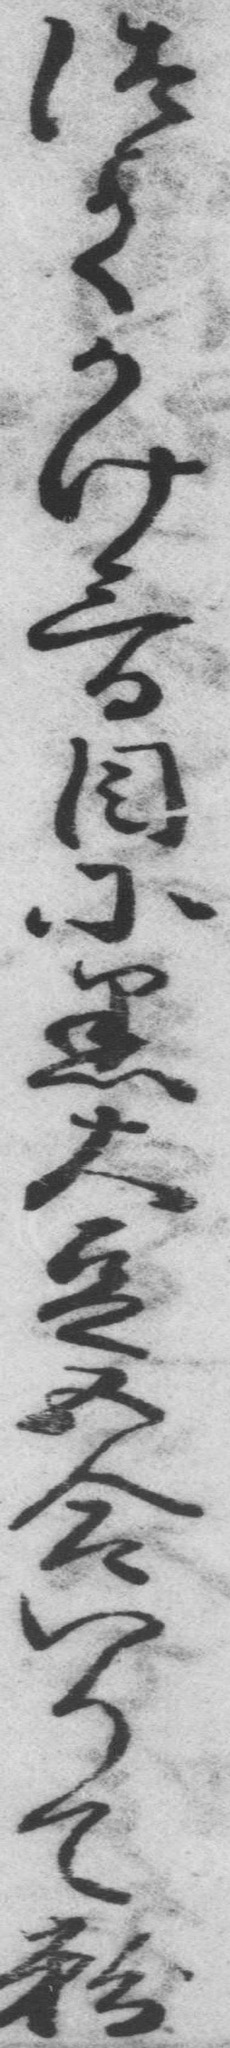つよくかけ三日目に黒大豆五合いりて粉
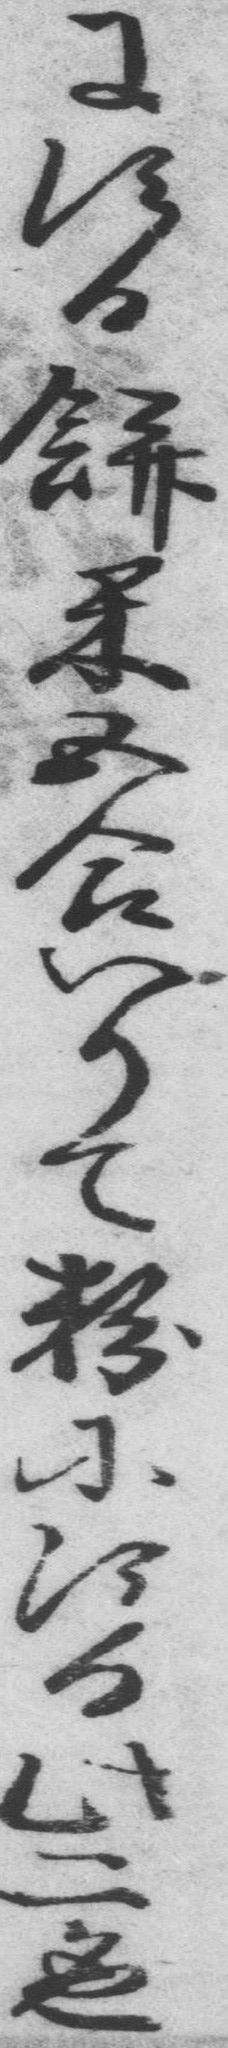にする餅米五合いりて粉にする此二色
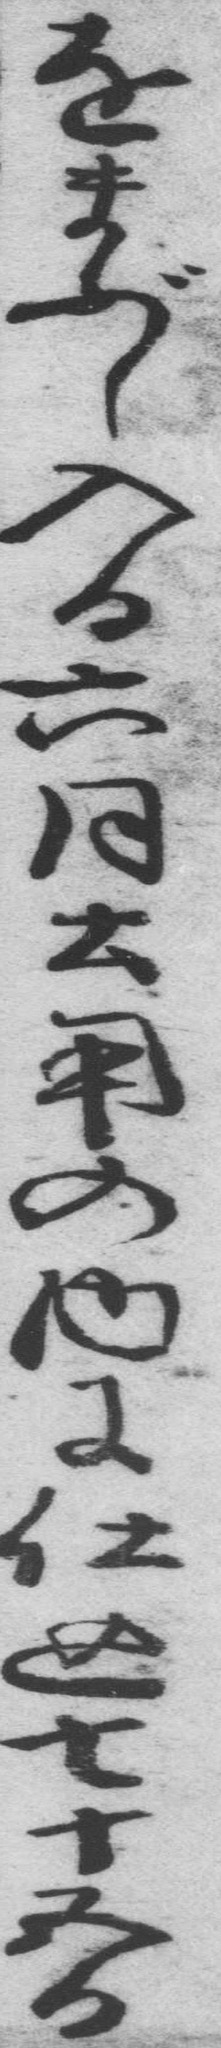をまぶし入る六月土用の内に仕込み七十五日
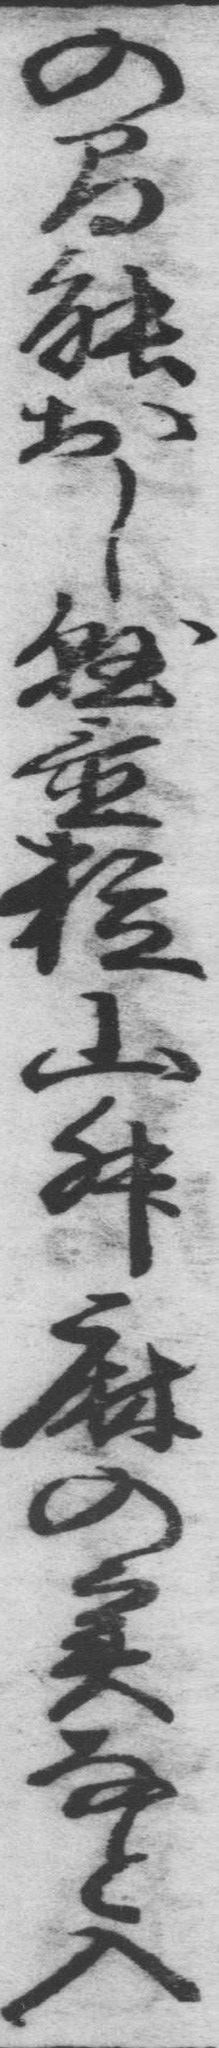の間能おし懸置粒山升麻の実なと入
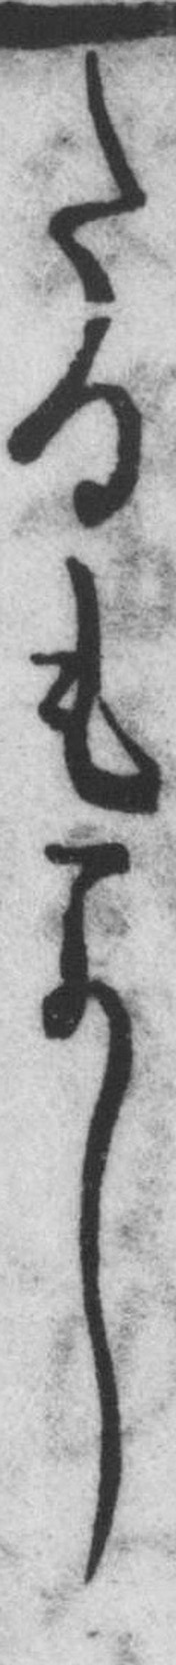たるもよし
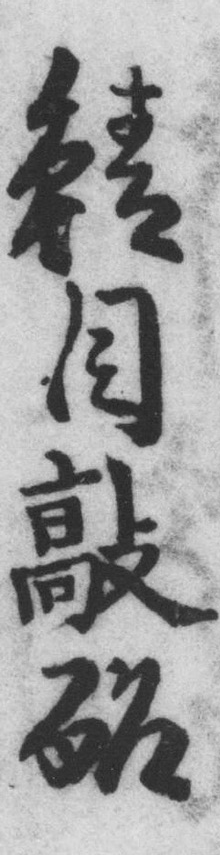鯖目敲酢
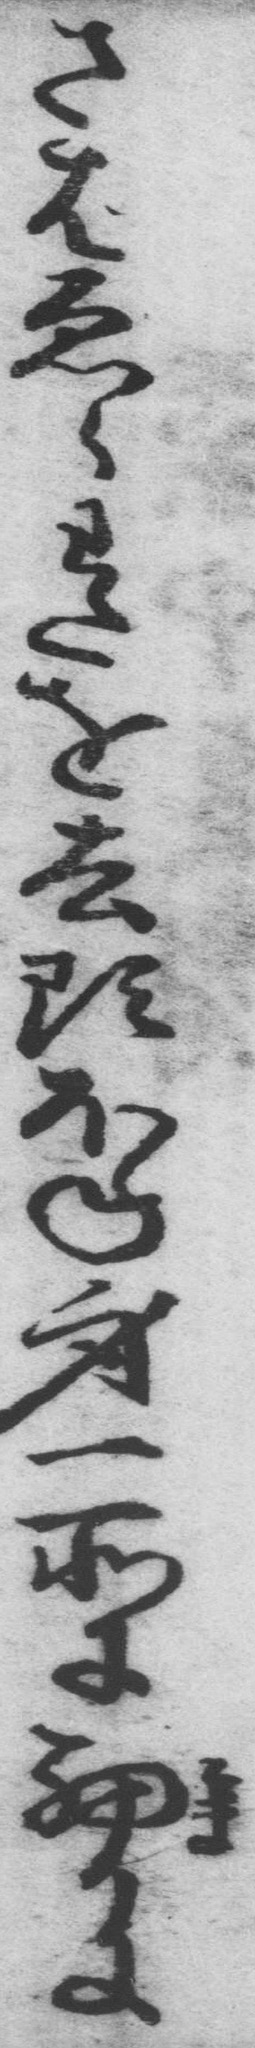さはえらわたを去頭ほね身一所に細かに
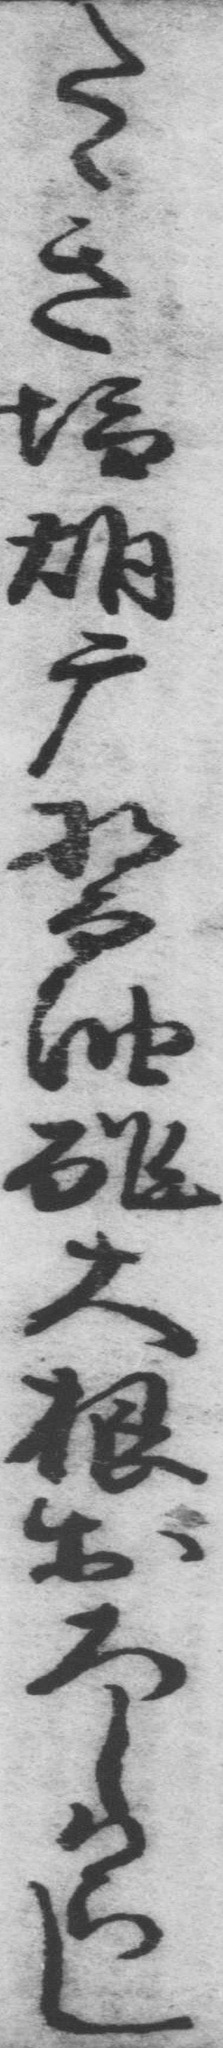たゝき塩胡麻醤油酢大根おろしからし
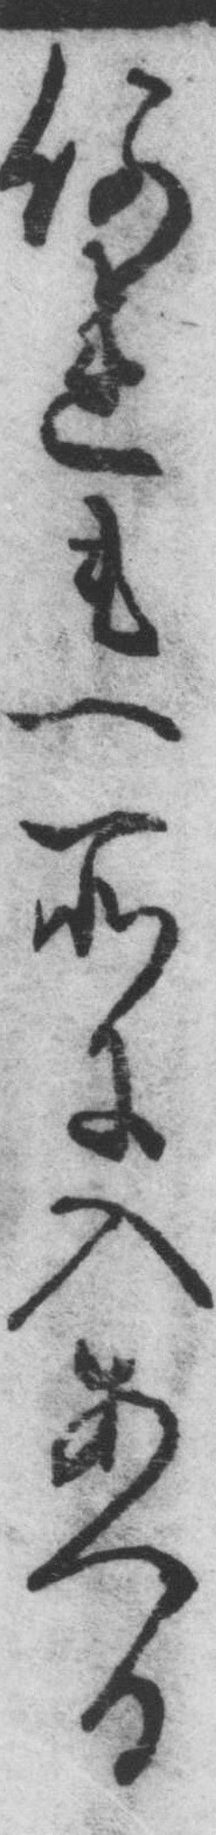何れも一所に入あへる
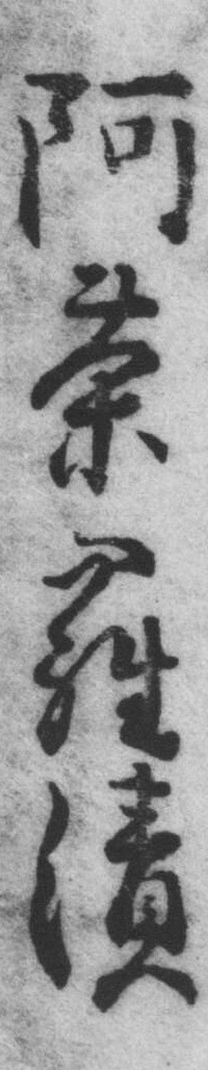阿茶羅漬

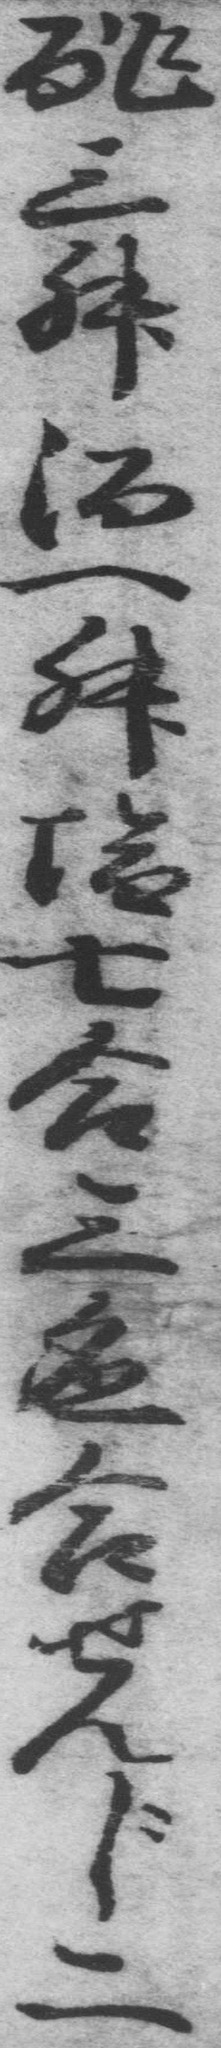酢三升酒一升塩七合三色合せんじ二
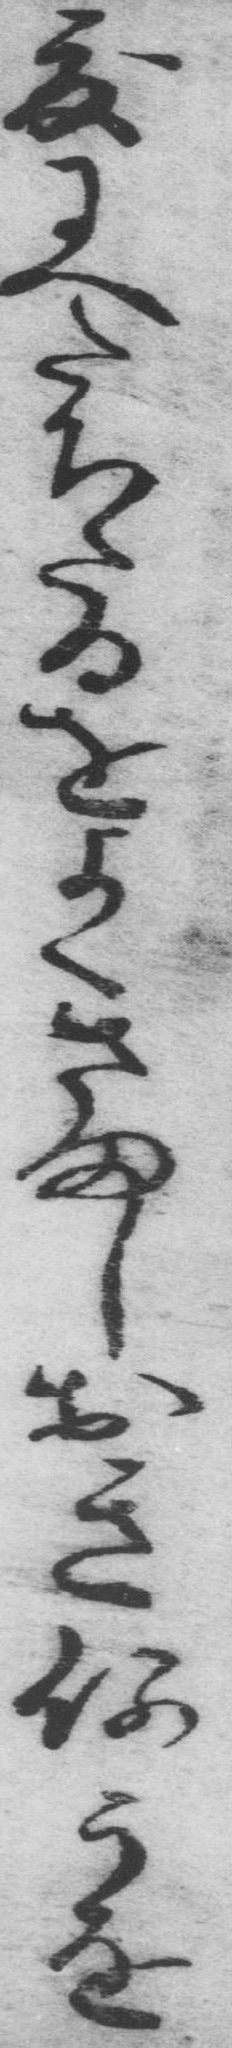度にへたちたるをよくさましおき何うを
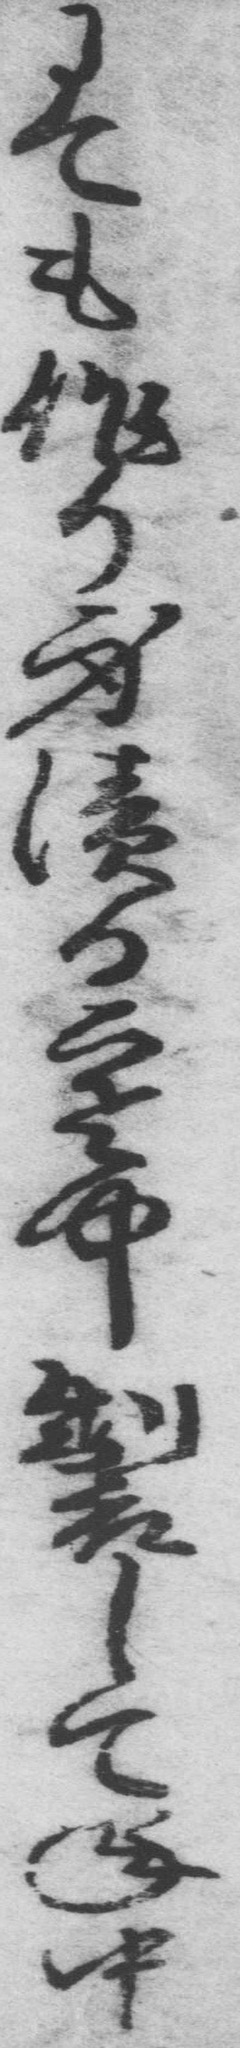にても作り身漬る寒中製して年中
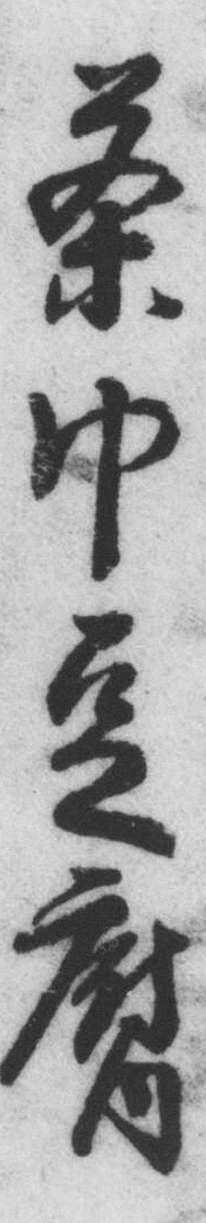茶巾豆腐
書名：料理山海郷
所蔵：大阪府立大学学術情報センター 国文学研究資料館
